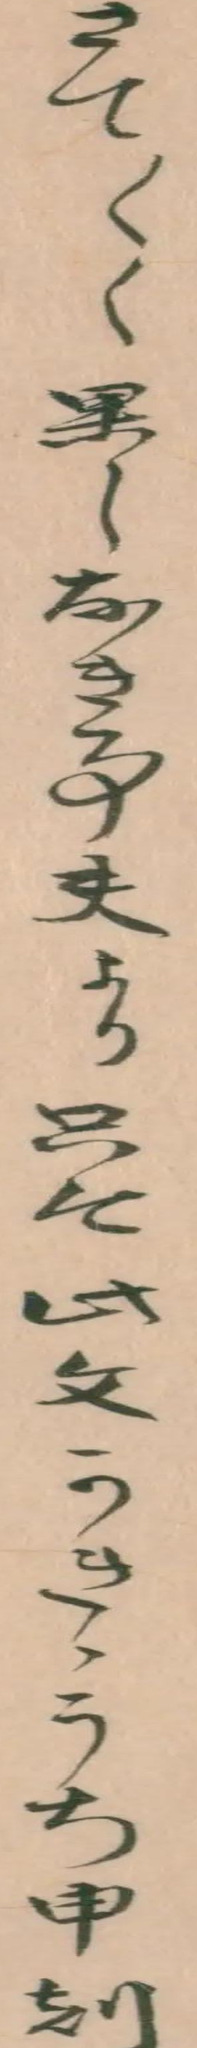さて〳〵〳〵果しなき事夫より只今此文かき候うち申刻
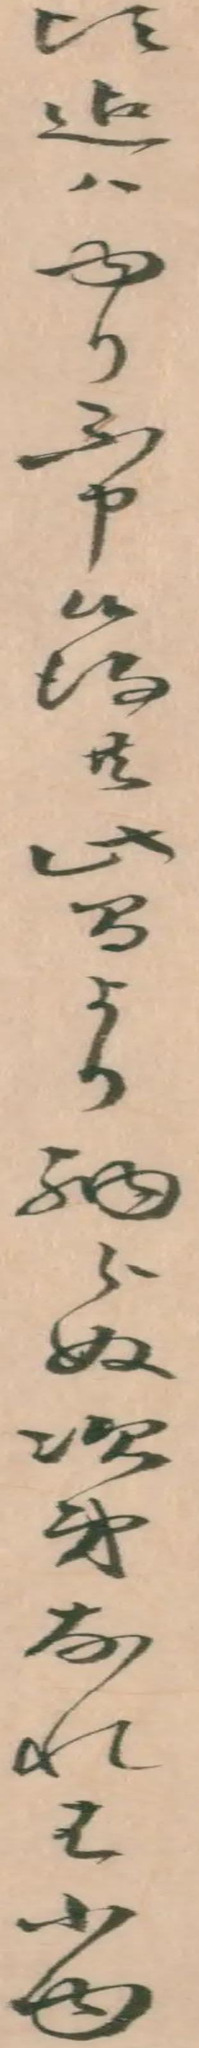頃迄ハゆり不申候得共此間より納らぬ次第なれは小ゆ
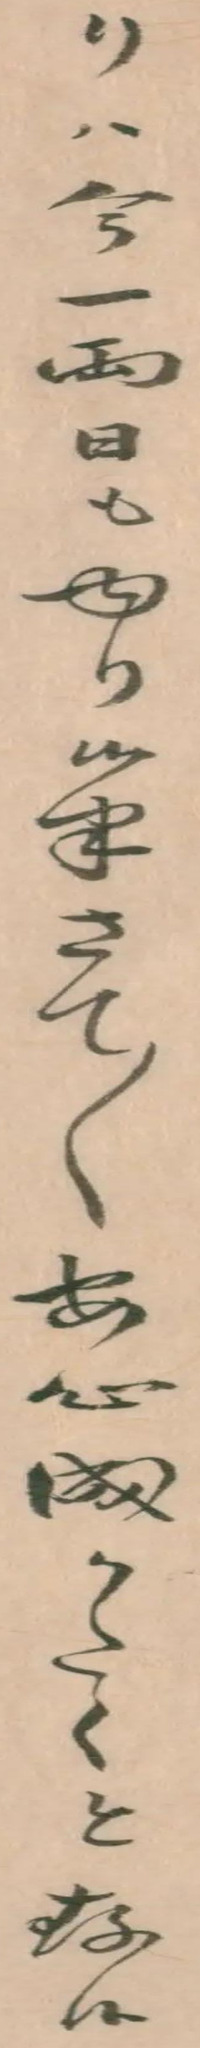りハ今一両日もゆり候事さて〳〵安心成かたく存候
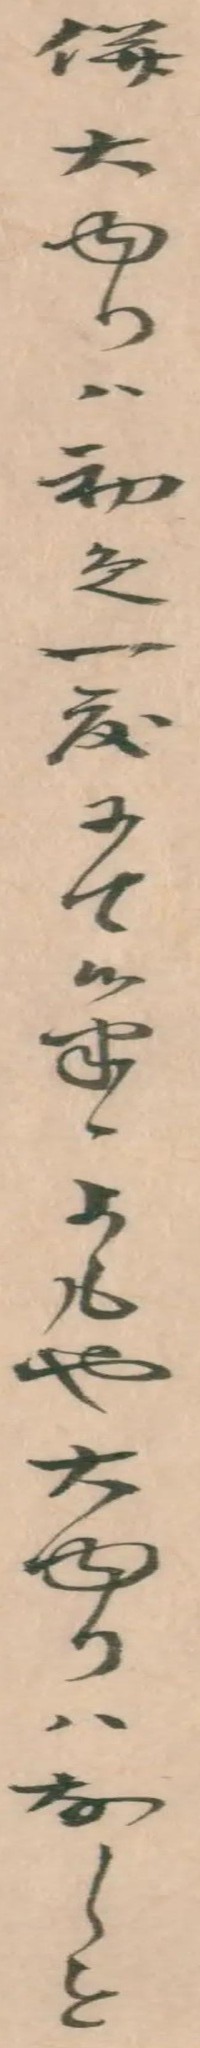併大ゆりハ初之一度にて候半候よもや大ゆりハなしと
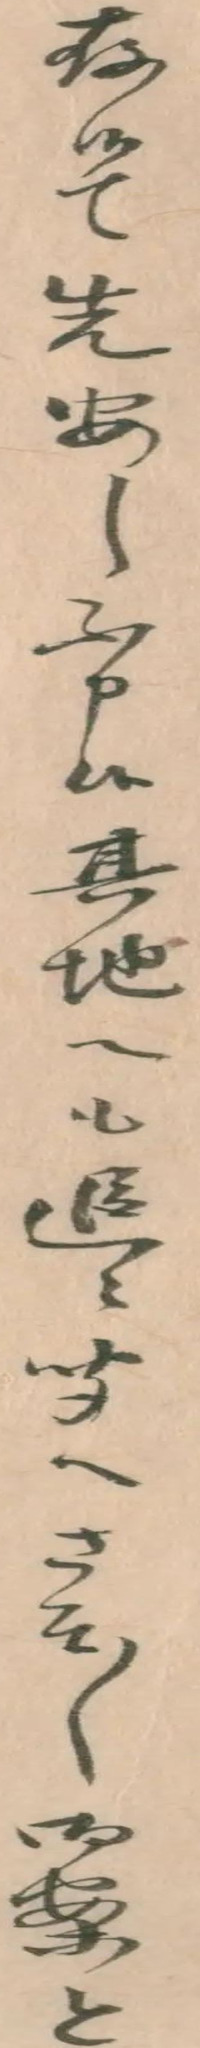存候て先安し不申候其チへも追々聞へさそ〳〵御案と
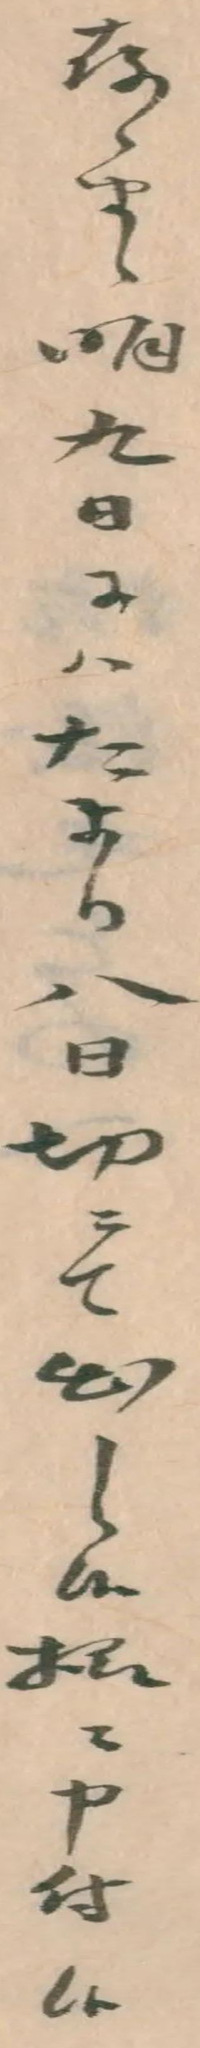存候間明九日にハたより八日切二て出し候様二申付候
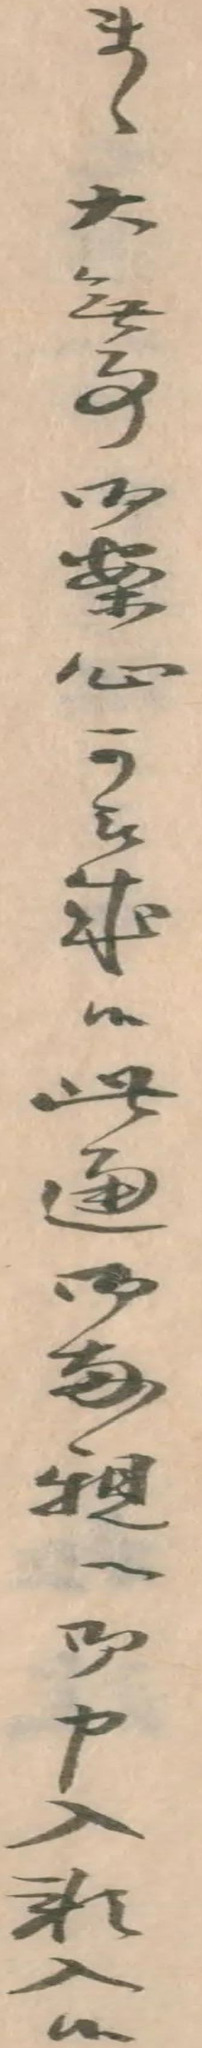まゝ大無事御案心可被成候此通御両親へ御申入御入候
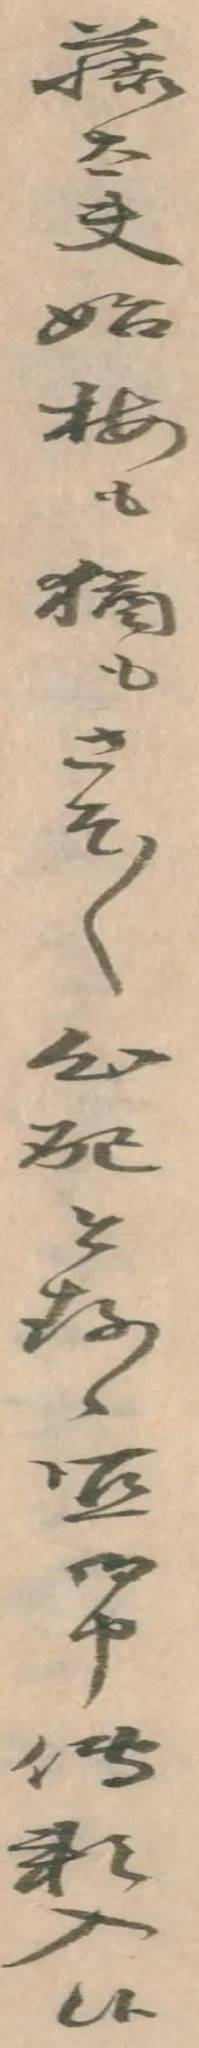藤太夫始梅も猶もさそ〳〵心配と存候宜御申伝頼入候

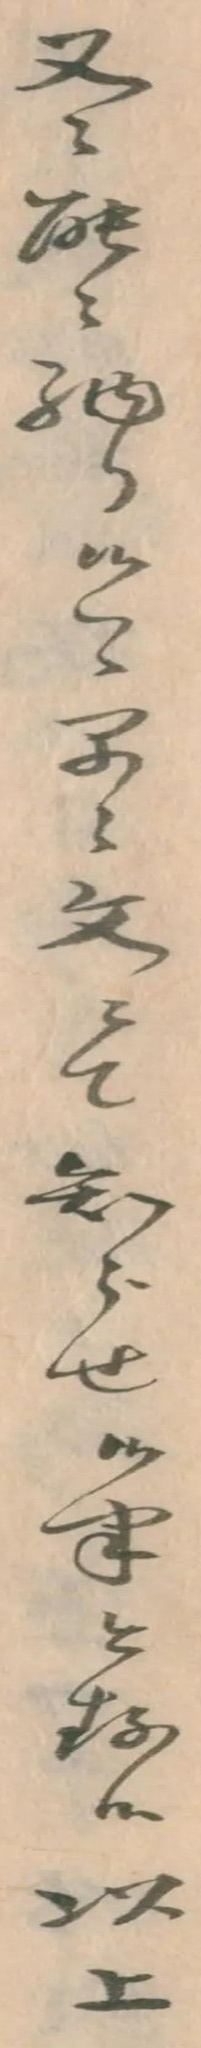又々能々納り候ハゝ早々文にて知らせ候事と存候以上
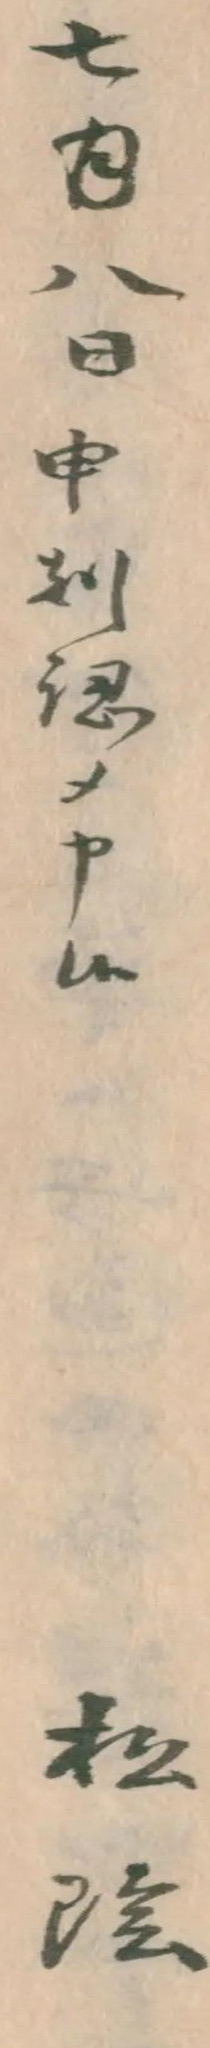七月八日申刻認メ申候松陰
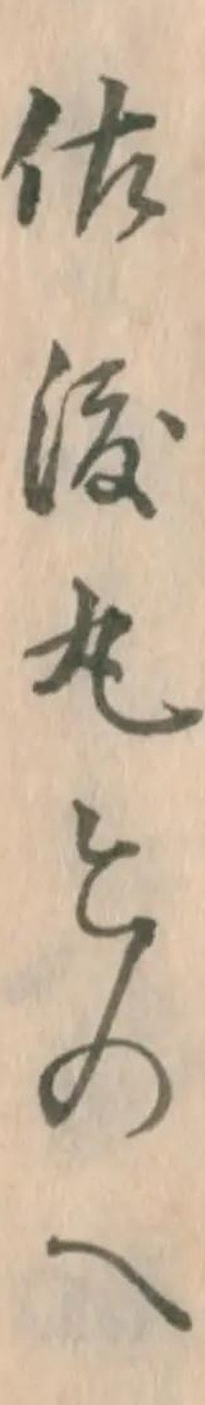佐渡丸とのへ
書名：京都地震
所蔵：国立国会図書館 National Diet Library, JAPAN
